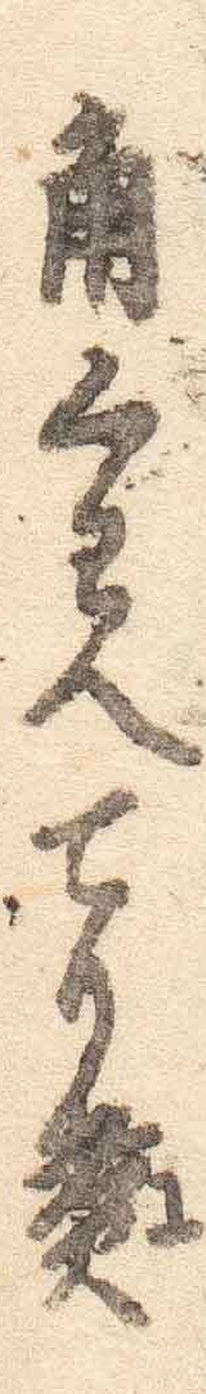角くわへてり煮
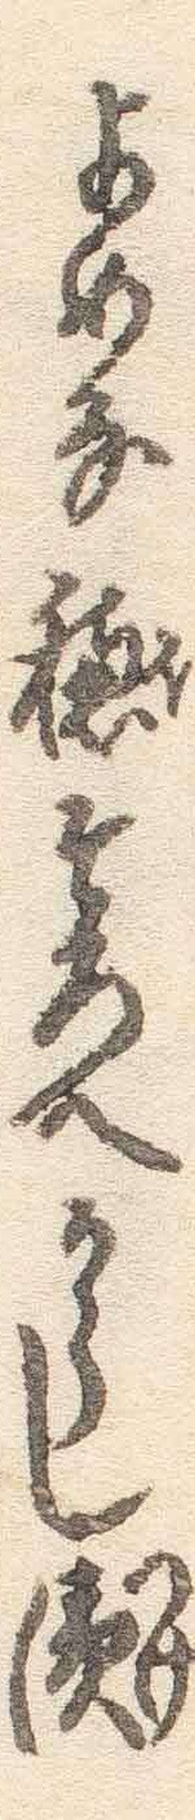よめな穂そろへからし漬
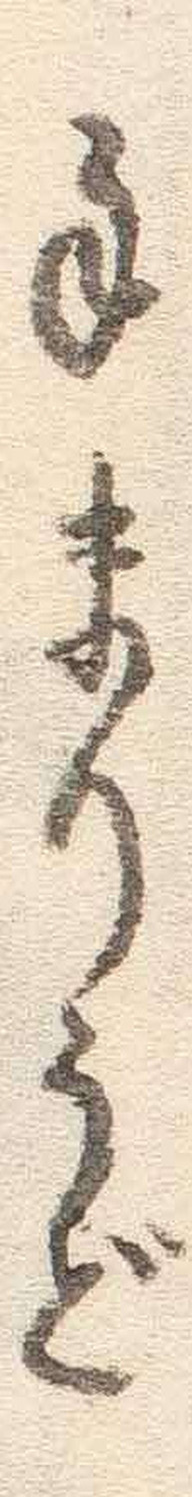手まりうど

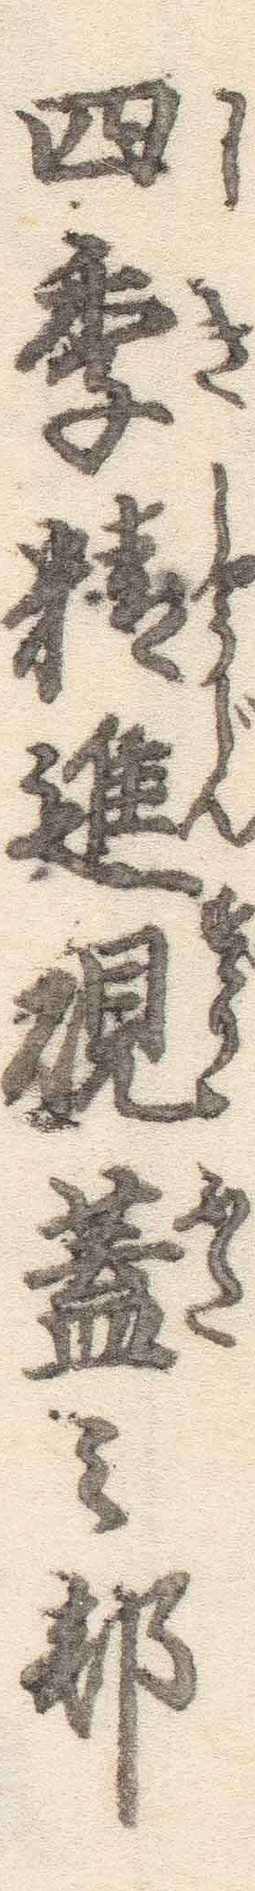四季精進硯蓋之部
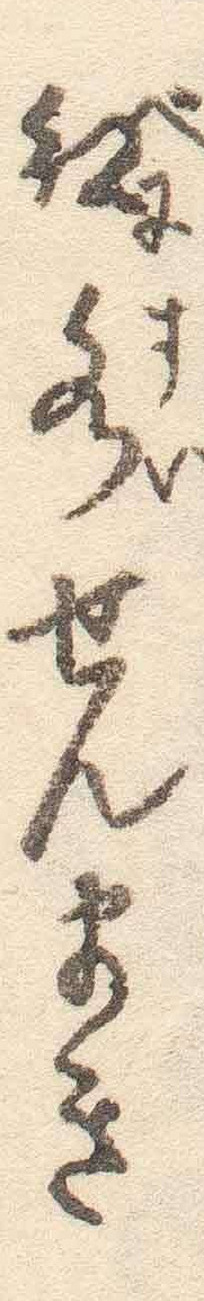紅水せんまき

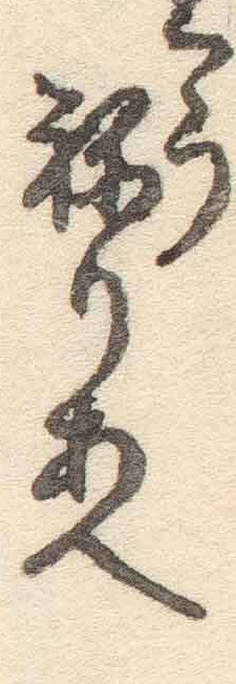ねりあへ
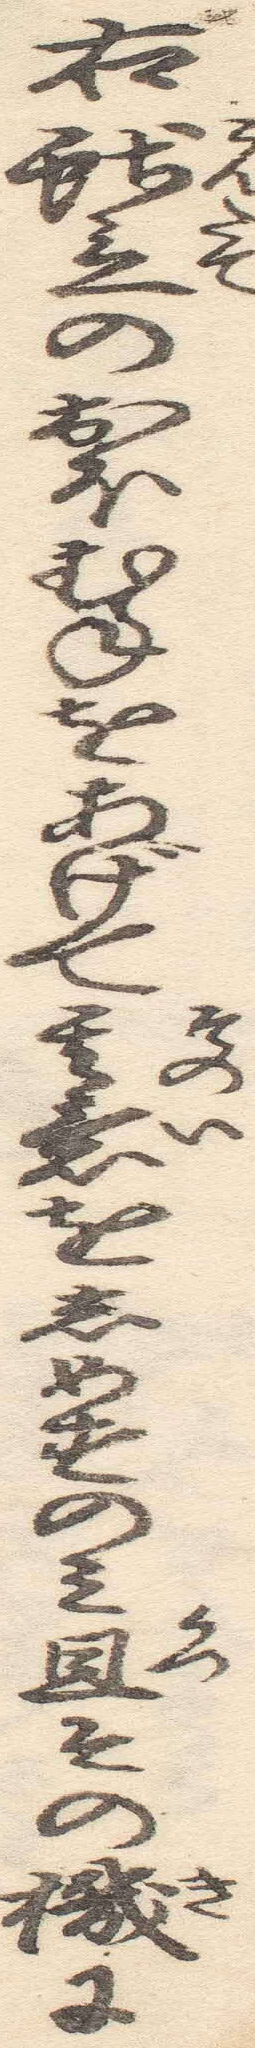右献立のおほむねをあげて其意をしめすのみ且その機に
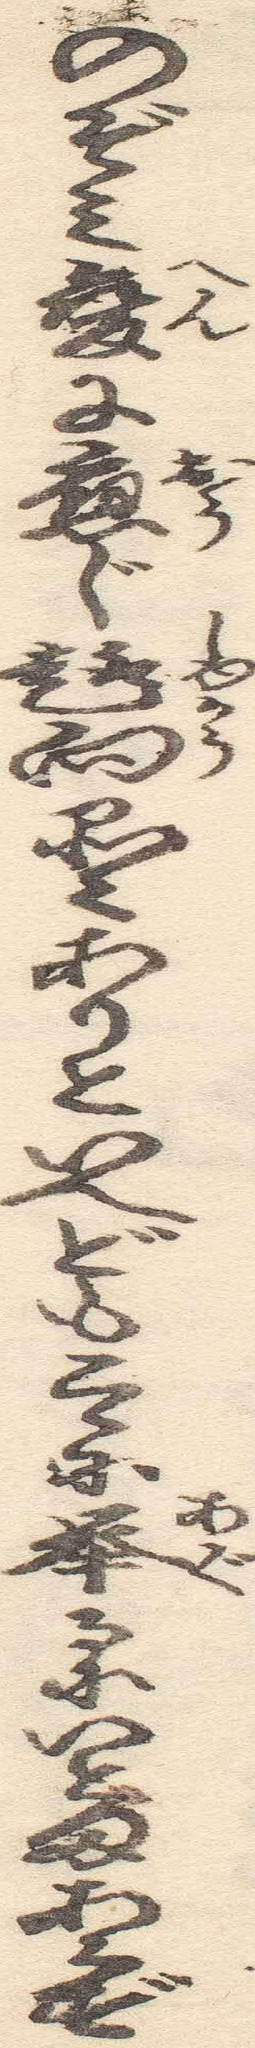のぞみ変に応じ趣向品々ありといへどもこゝに挙るにいとまあらず
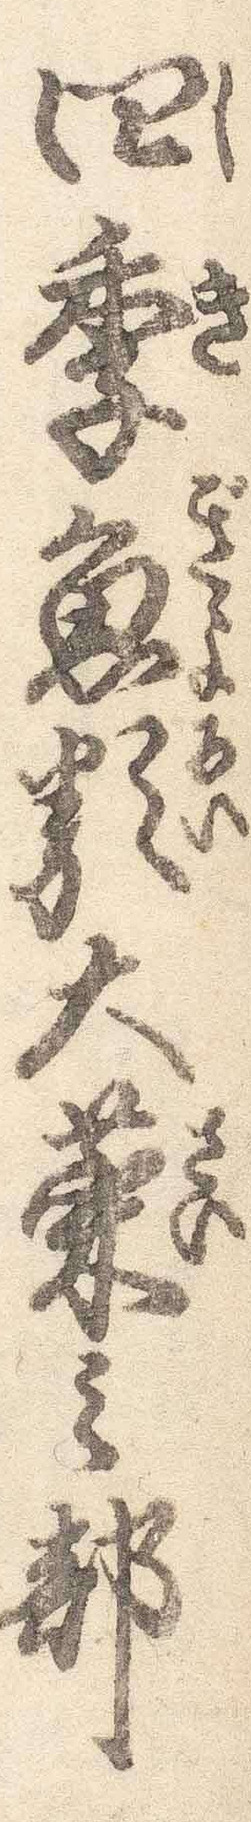四季魚類大菜之部

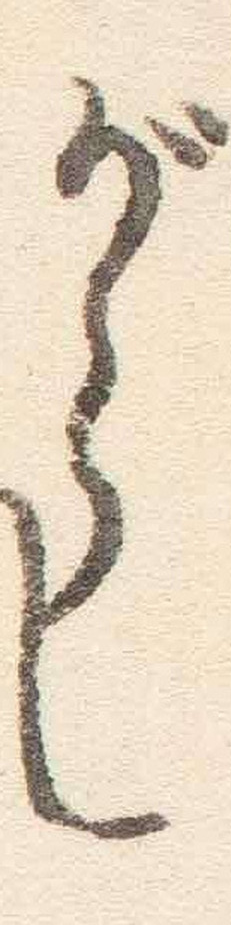がらし
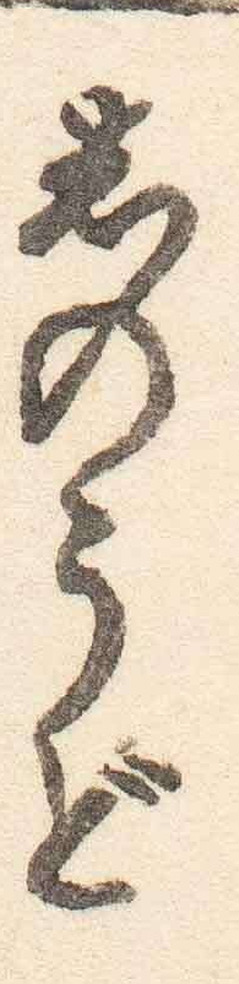しのうど
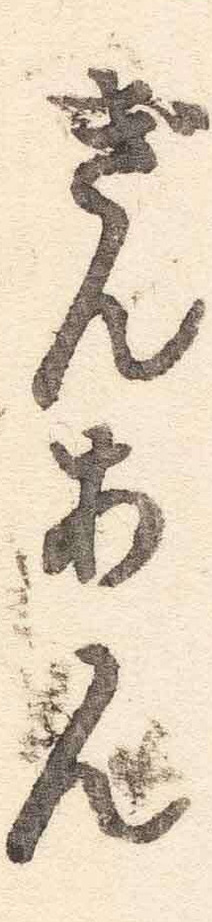ぎんあん
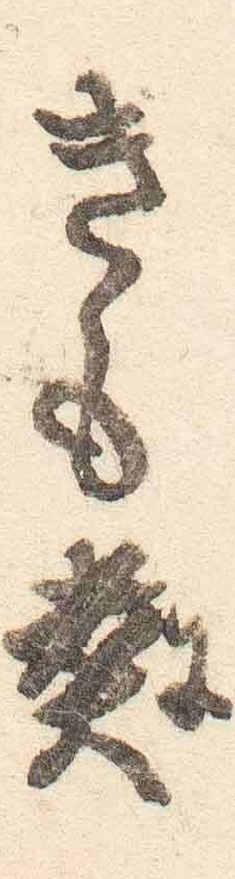きも煮
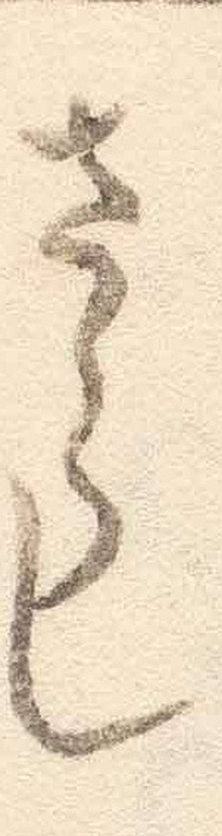がらし
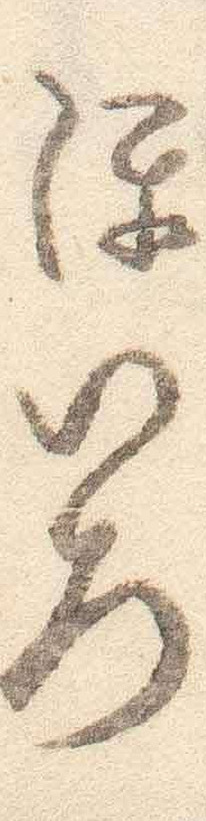ほいろ
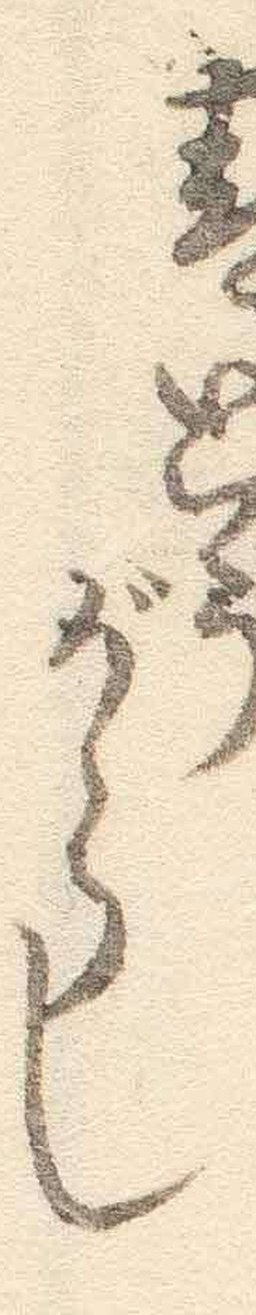がらし
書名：料理通
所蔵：東京学芸大学附属図書館 国文学研究資料館
